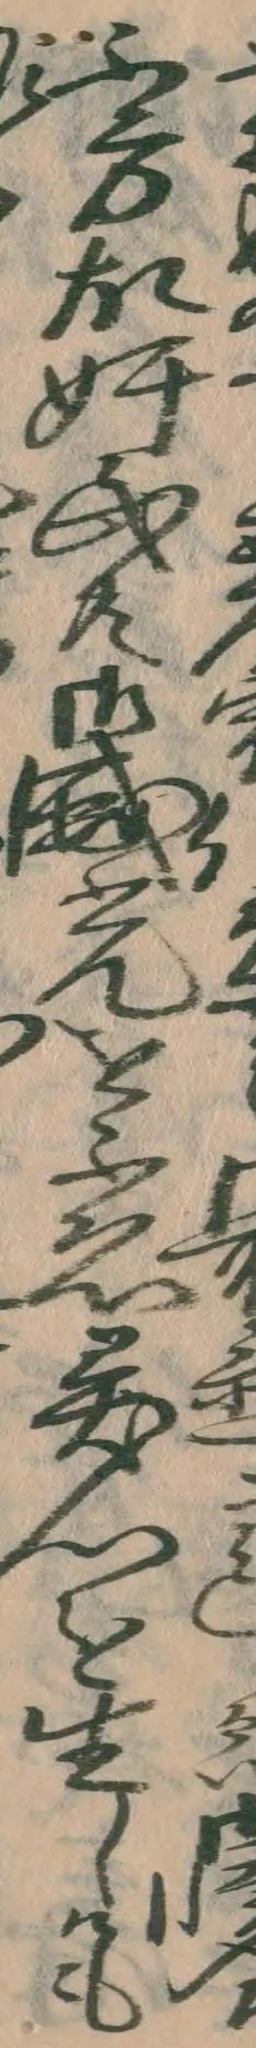不方故奸民共御威光を不恐異心を生し候も
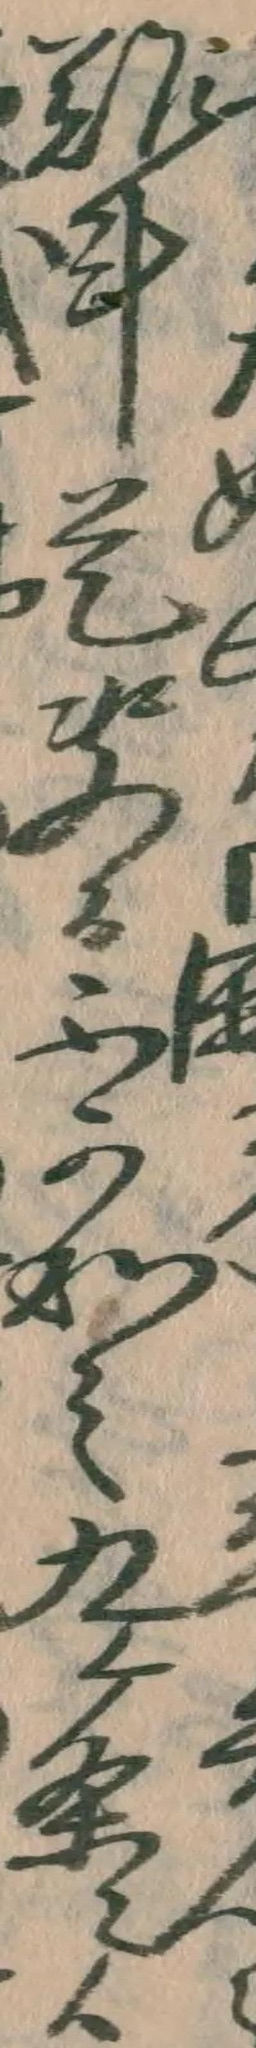難斗是決而不可和之九ケ条ニ候
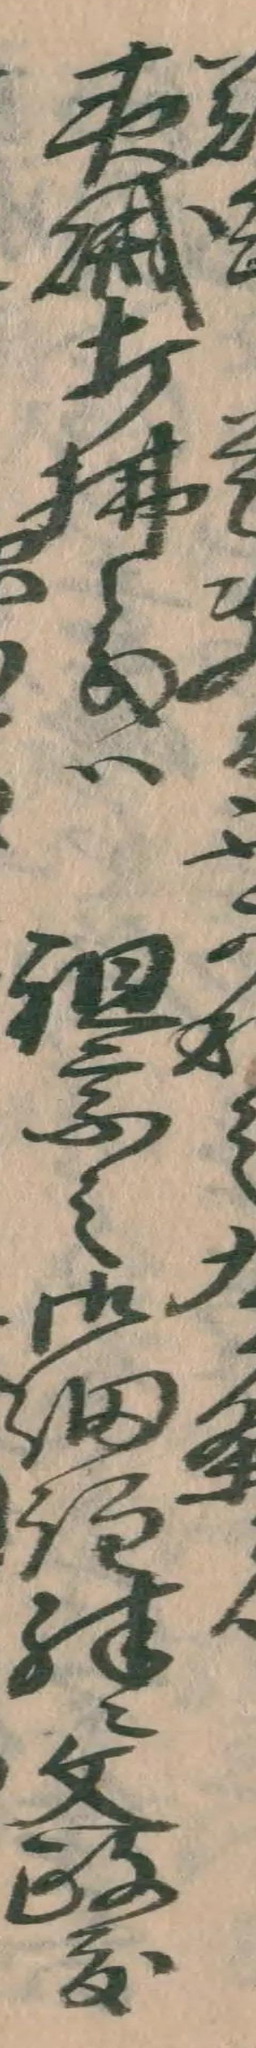一夷賊打拂之義ハ祖宗之御細注殊ニ文政度
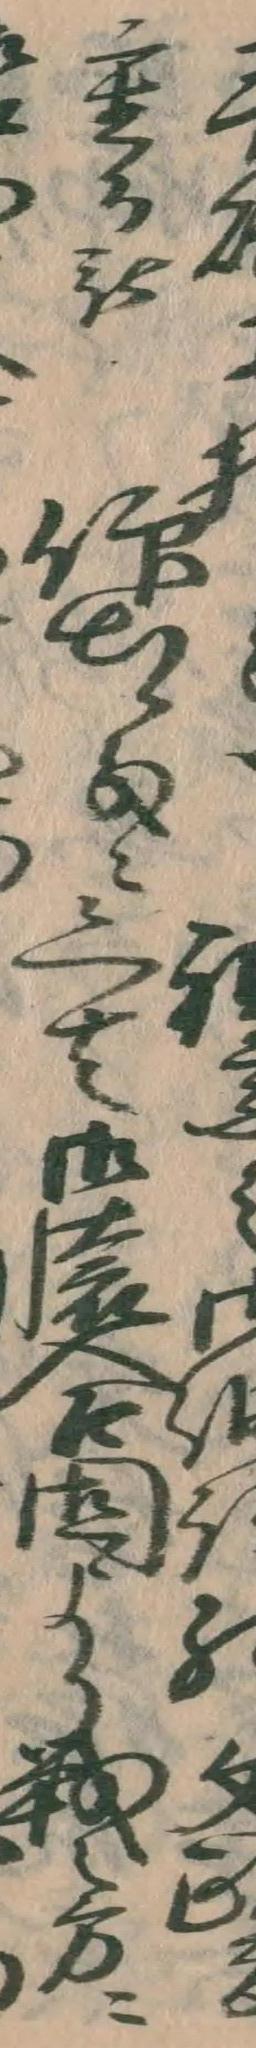重而被仰出候義ニ候へ者御懐合固より戦之方ニ
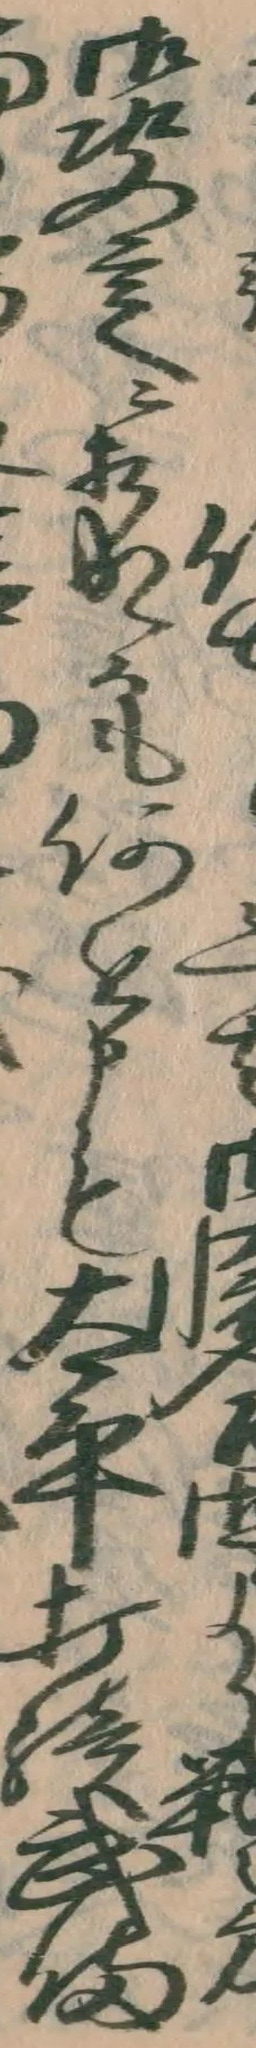御決定ニ相成候而も何を申も太平打続武備
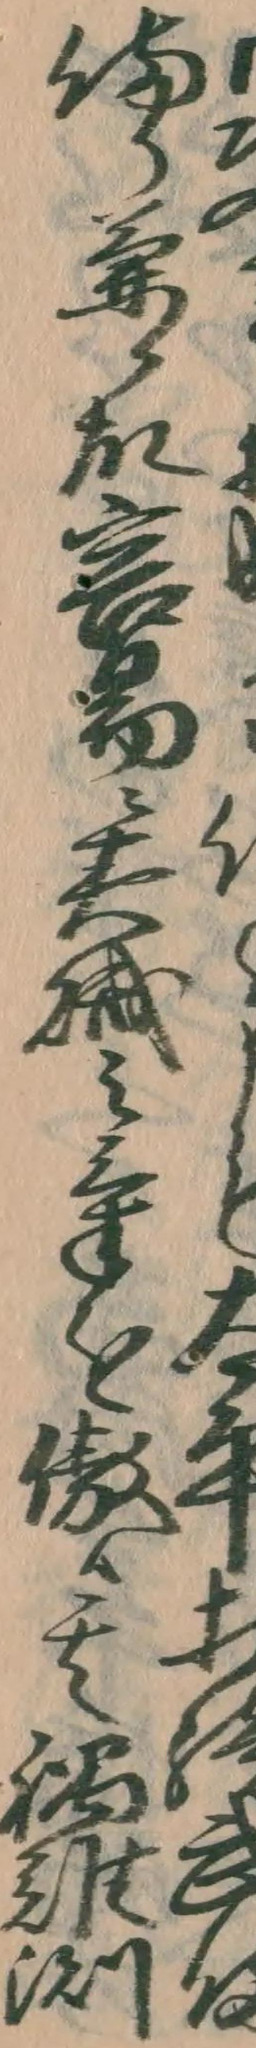備り兼候故容易ニ夷賊之氣を傲候其禍難測
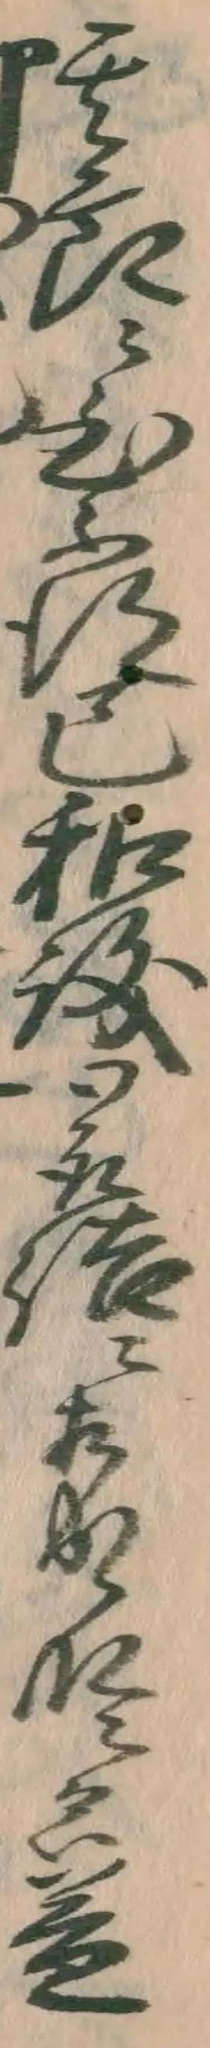其節ニ至不得已和議御取結ニ相成候様ニ而ハ益
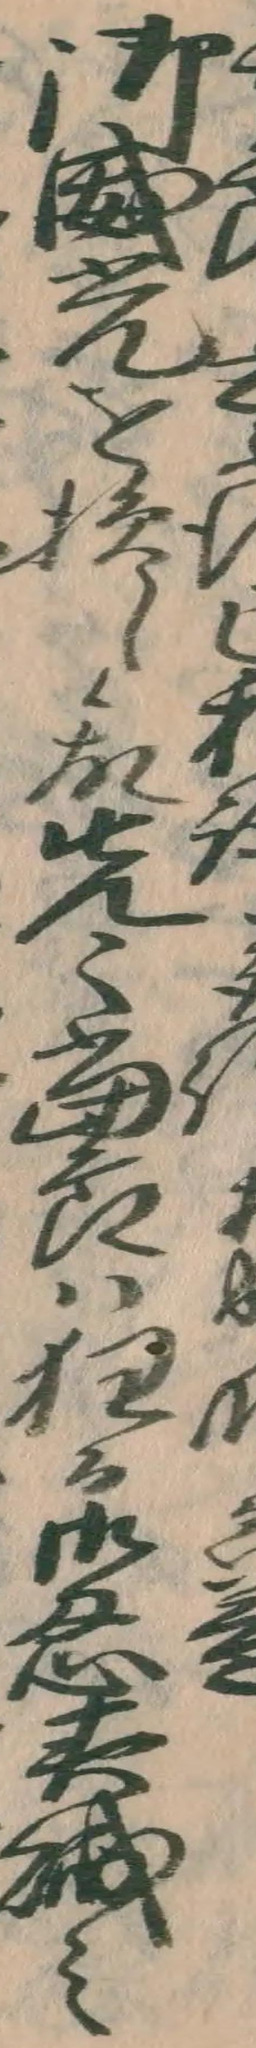御威光を損し候故先々當節は枉而御忍夷賊之
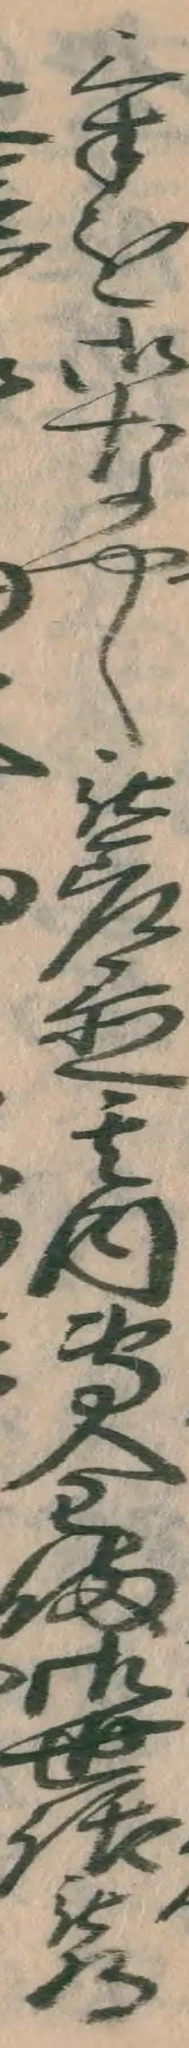氣を御なやし被差置其内専全備御世話被為
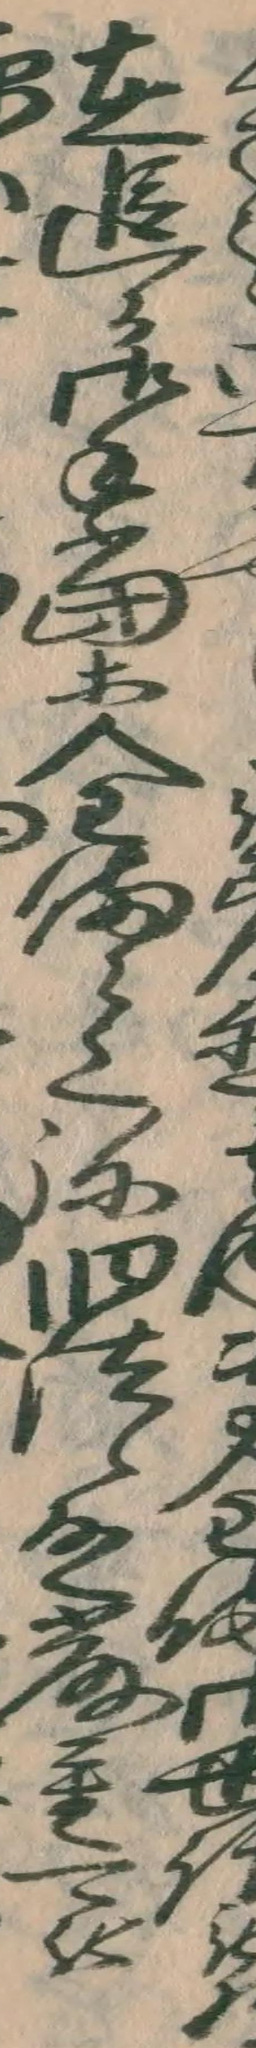在追而御手當等全備之上弥旧法之通厳重可被
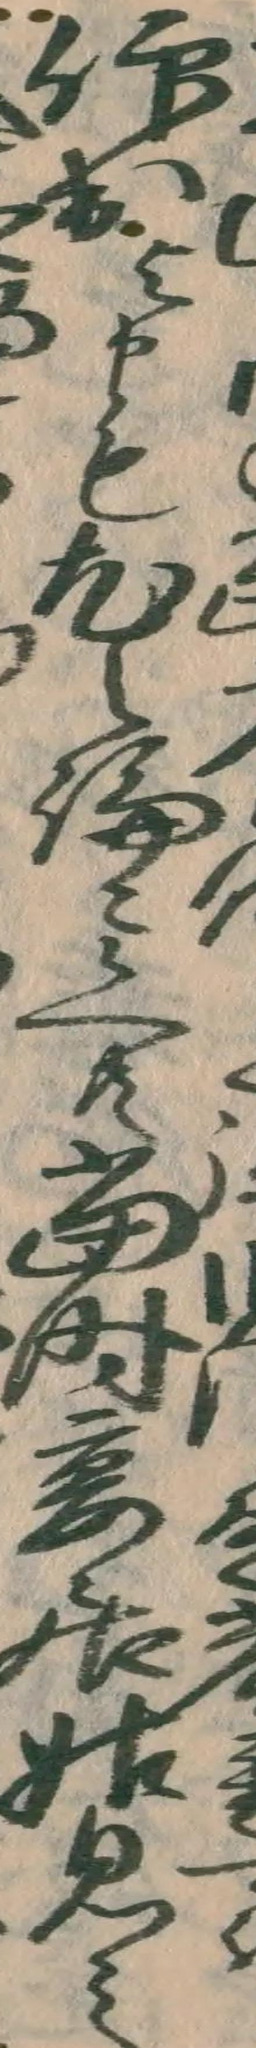仰出と申も尤之論ニ候へ共當時妄居姑息之
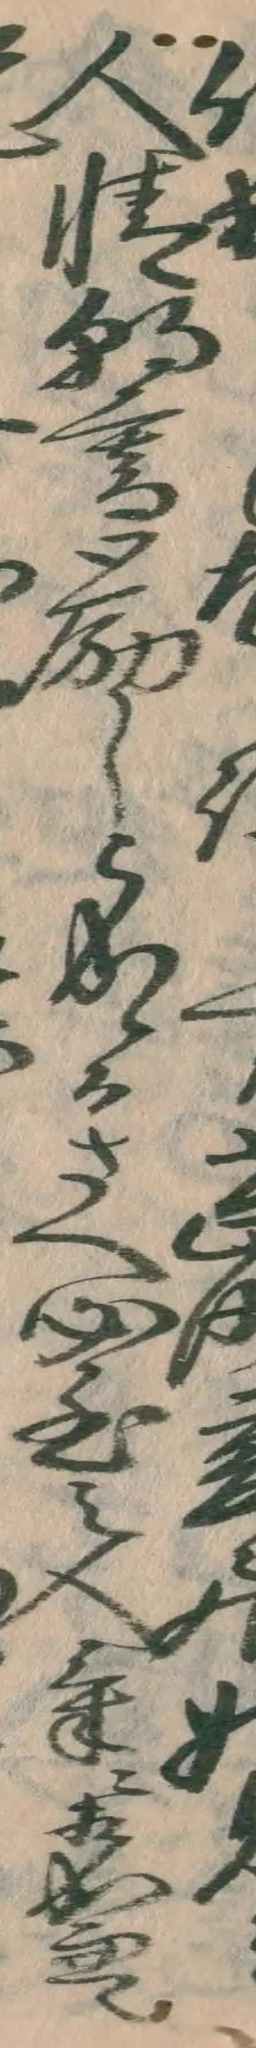人情朝暮御励し被成候而さへ必至之人氣ニ相成兼候
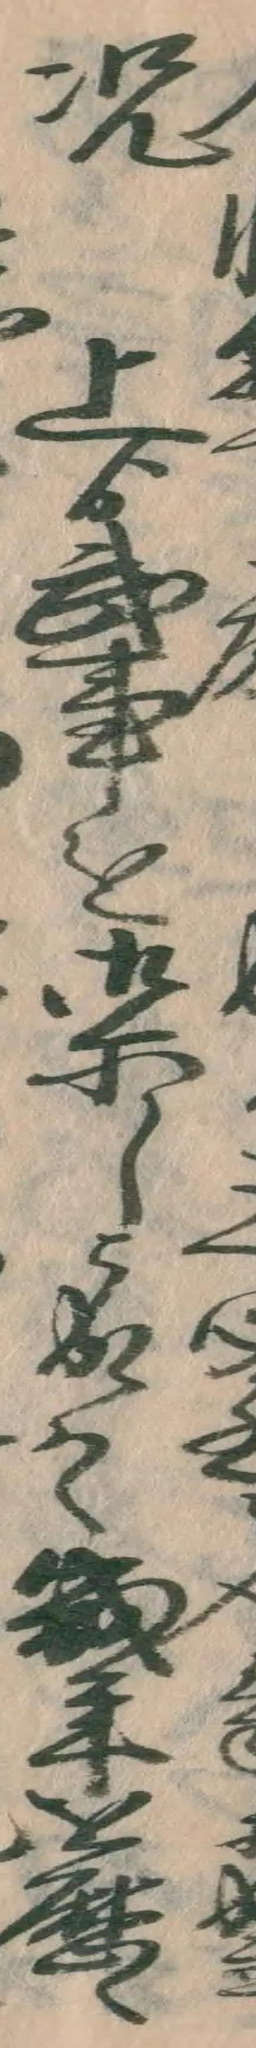况上ゟ武事を御示し被成候ハヽ幾年を歴候
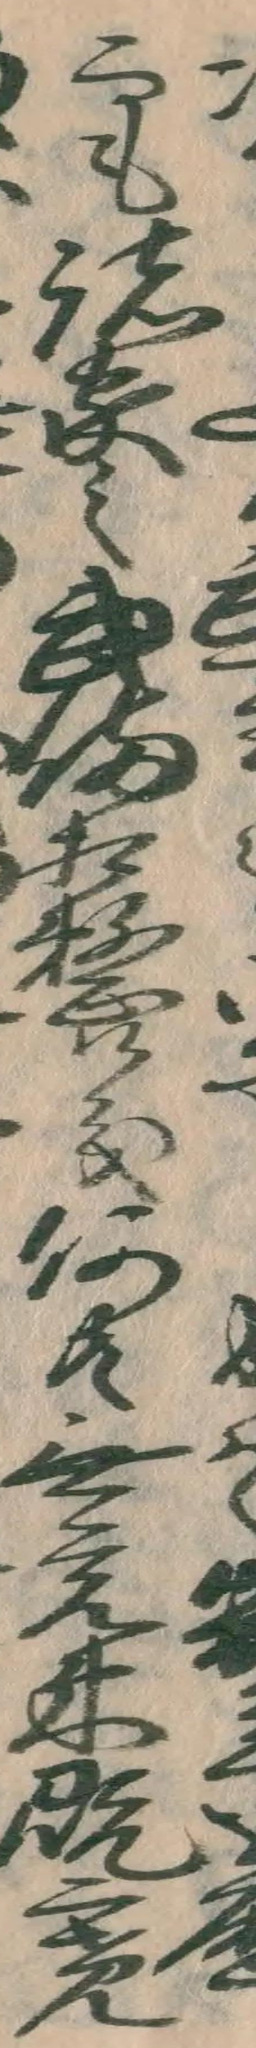而も諸家之武備相整候義何共無覚束既寛
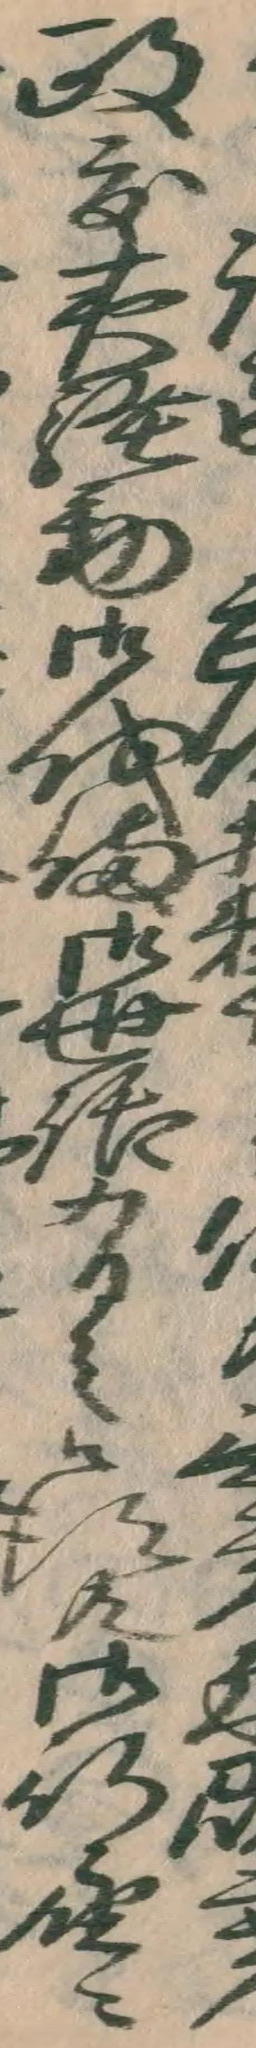政度夷騒動御城備御世話有之候得共御行届ニ
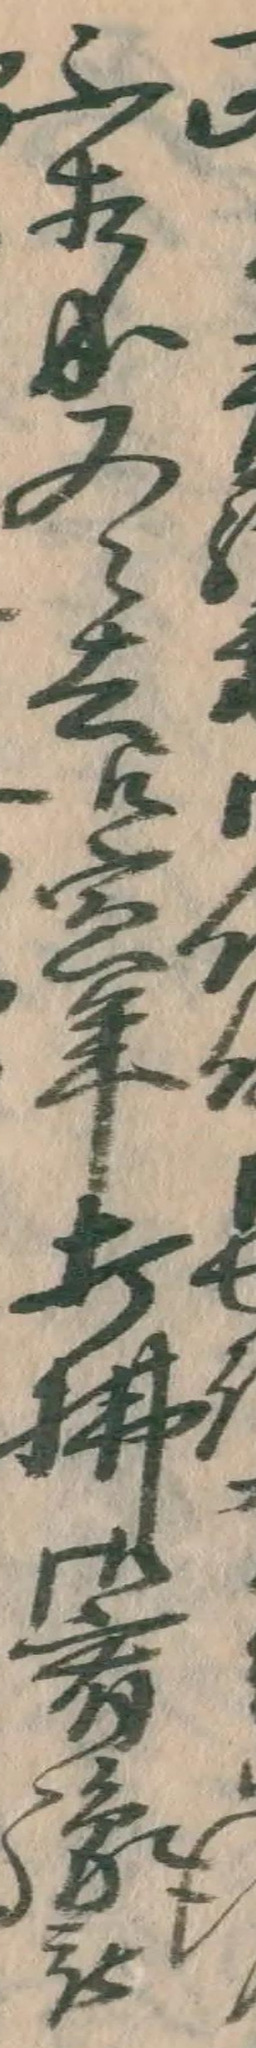不相成又々去ル寅年打拂御宥豫被
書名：麗斎叢書. 20
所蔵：国立国会図書館 National Diet Library, JAPAN
